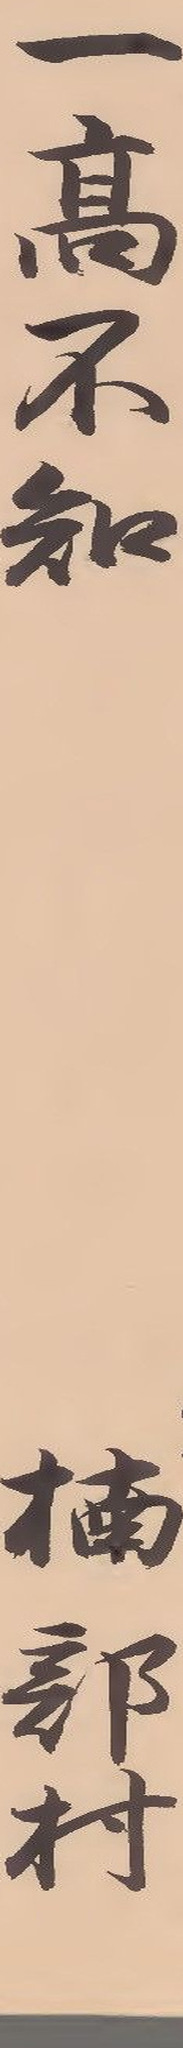一高不知中村
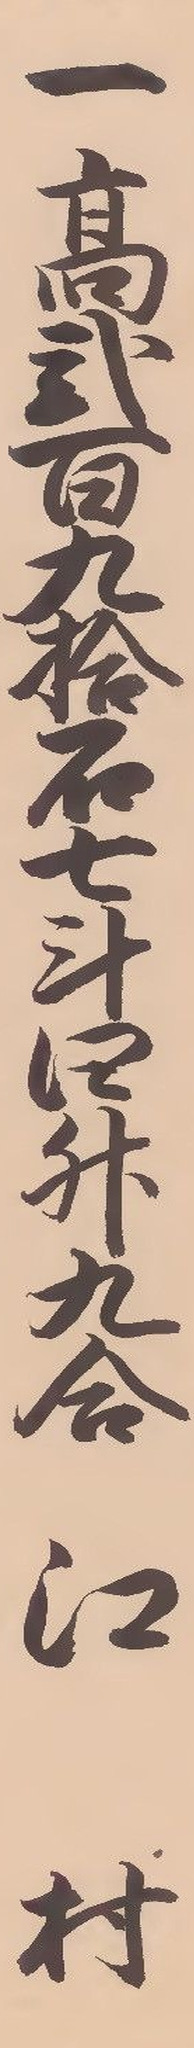一高弐百九拾石七斗四升九合江村
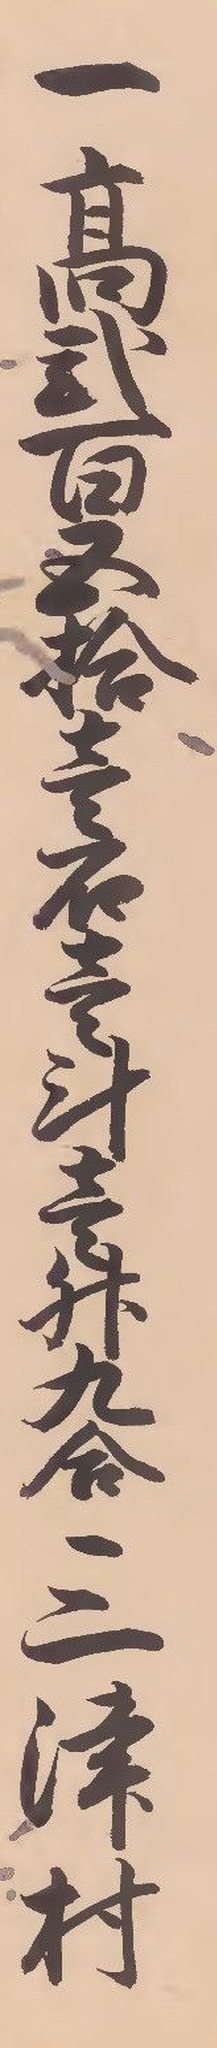一高弐百五拾壱石壱斗壱升九合三津村

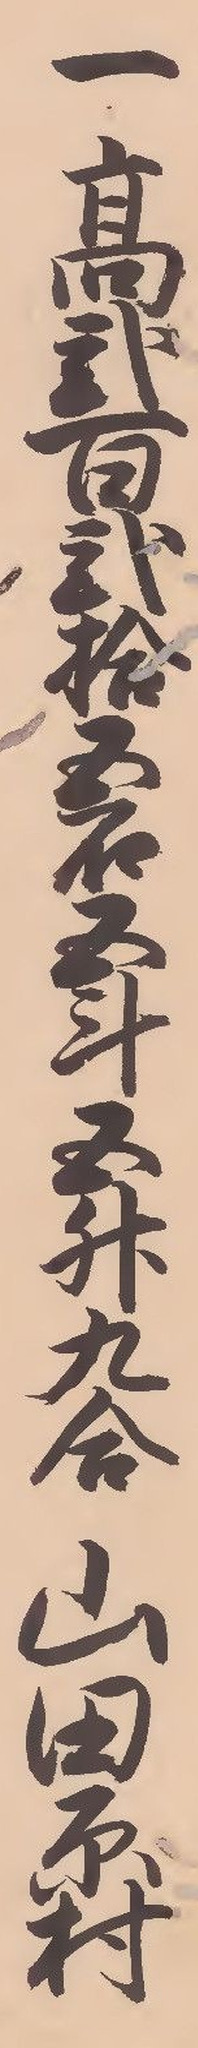一高弐百弐拾五石五斗五升九合山田原村
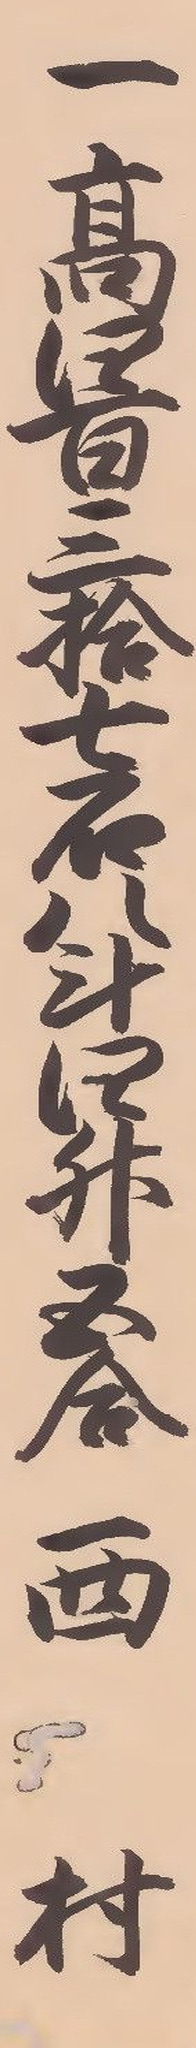一高四百三拾七石八斗四升五合西村
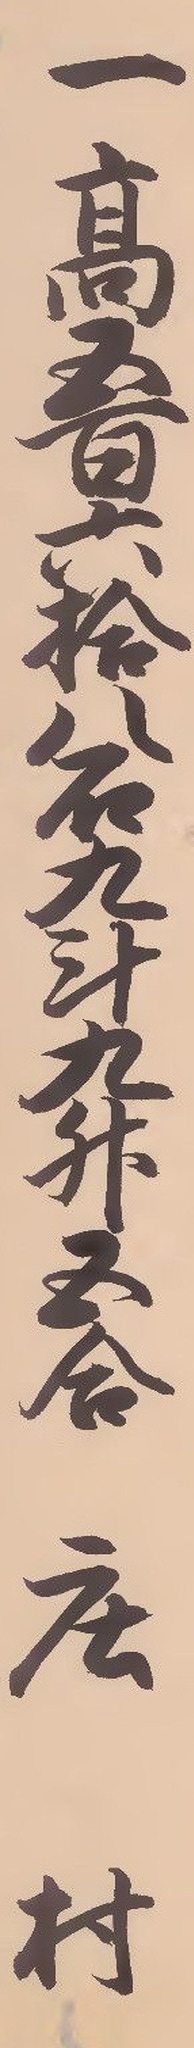一高五百六拾八石九斗九升五合庄村
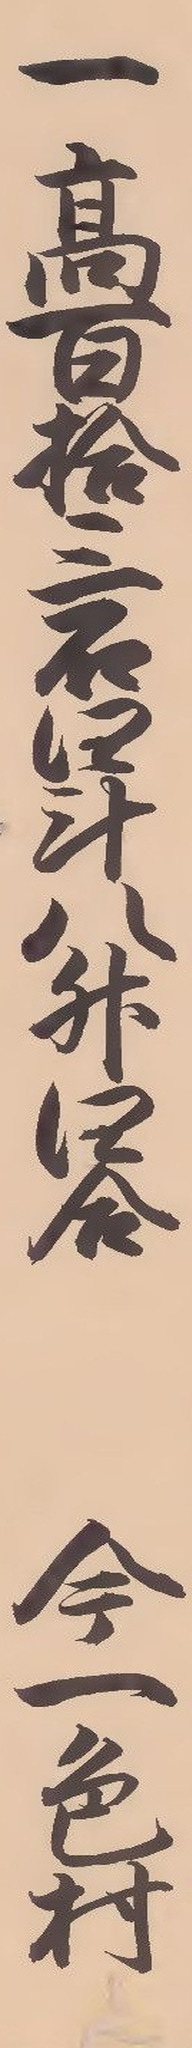一高百拾三石四斗八升四合今一色村

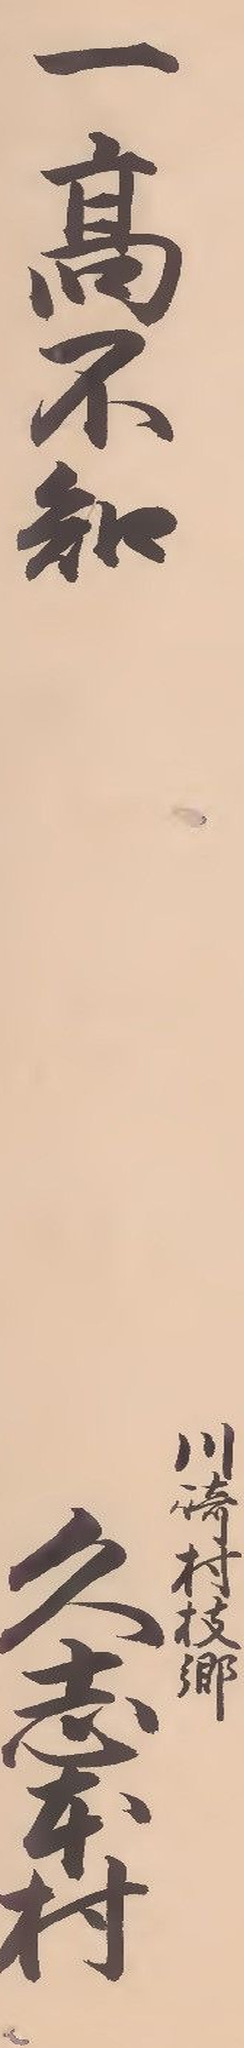一高不知通村

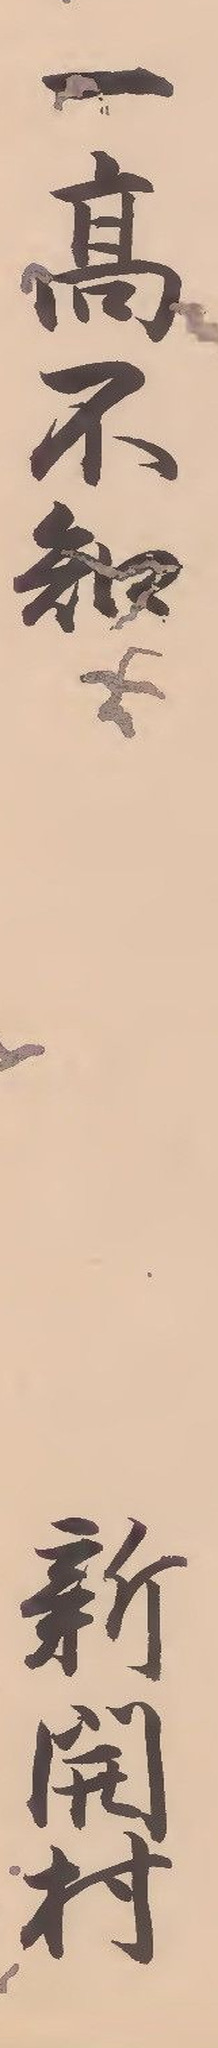一高不知新開村

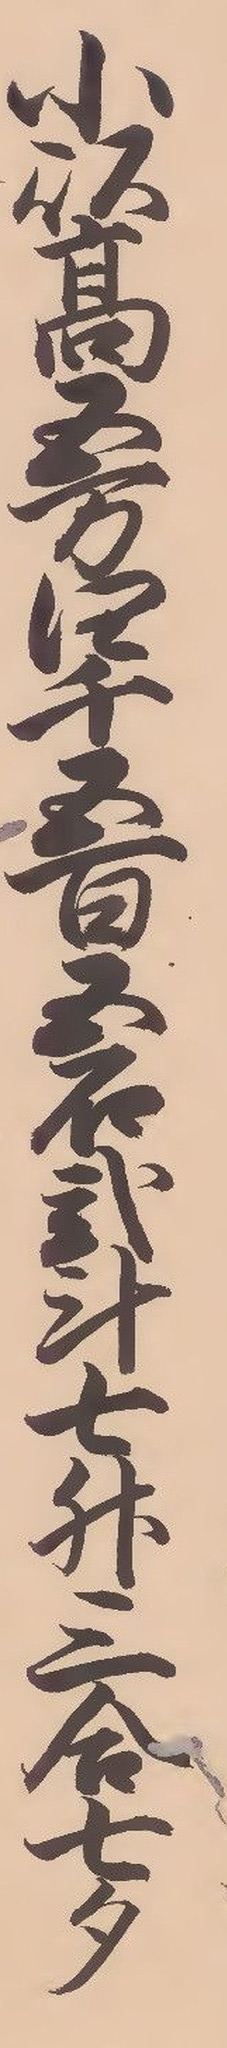小以高五万四千五百五石弐斗七升三合七勺
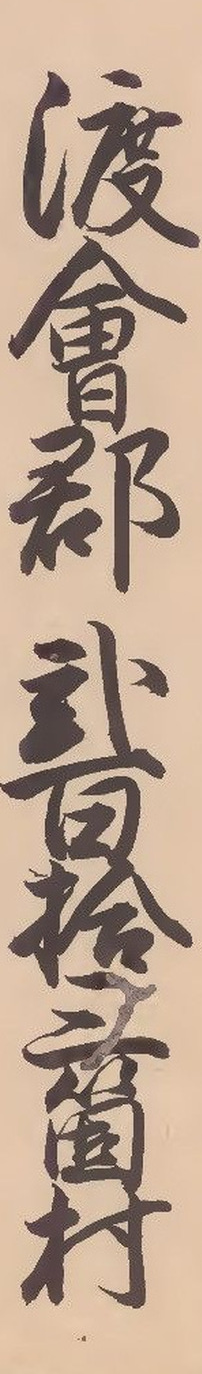渡会郡弐百拾三箇村
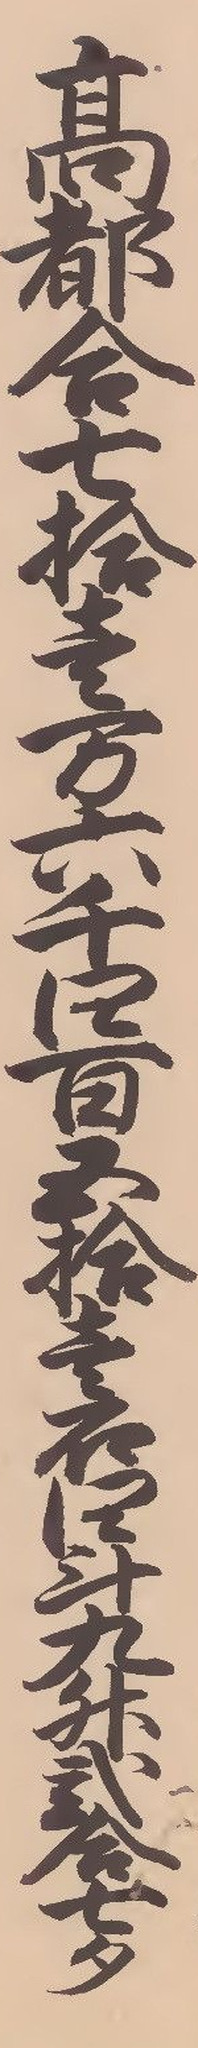高都合七拾壱万六千四百五拾壱石四斗九升弐合升七勺
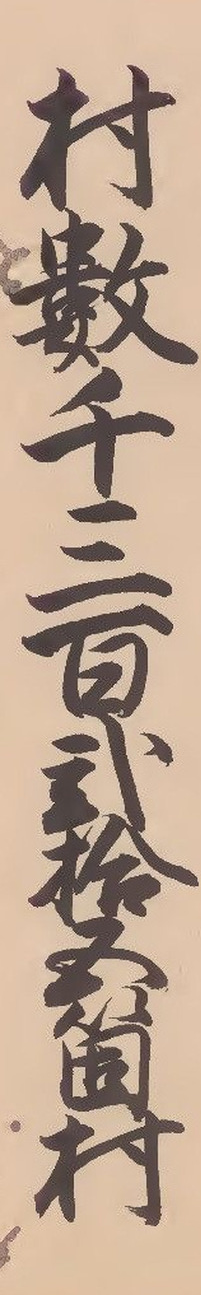村数千三百弐拾五箇村

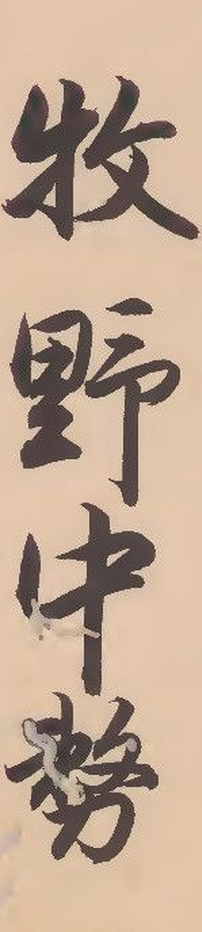牧野中務
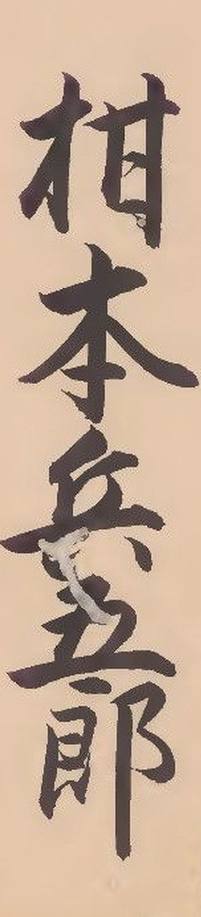柑本兵五郎
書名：伊勢国郷帳
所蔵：国立公文書館 National Archives of Japan
